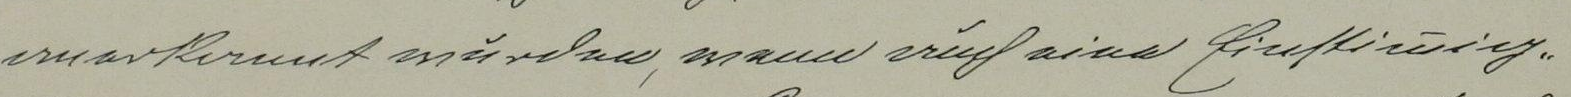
anerkannt wurden, wenn auch eine Einstimmig-
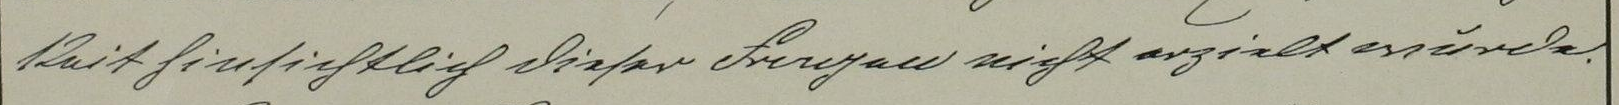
keit hinsichtlich dieser Fragen nicht erzielt wurde.
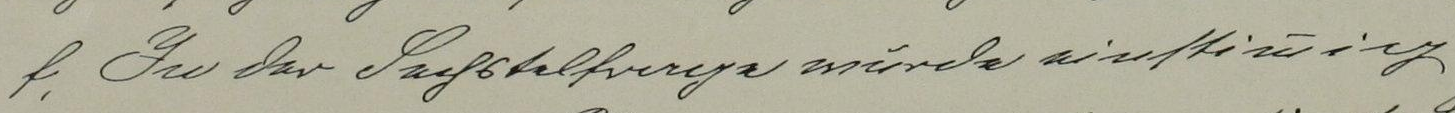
f. In der Sechstelfrage wurde einstimmig
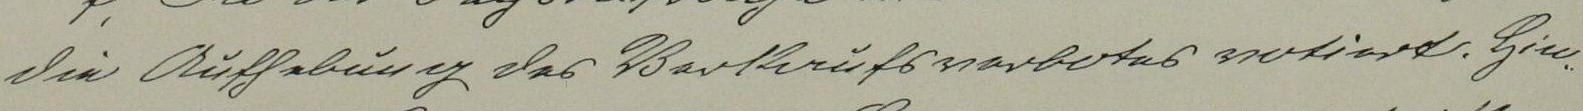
die Aufhebung des Barkaufsverbotes notiert. Hin-
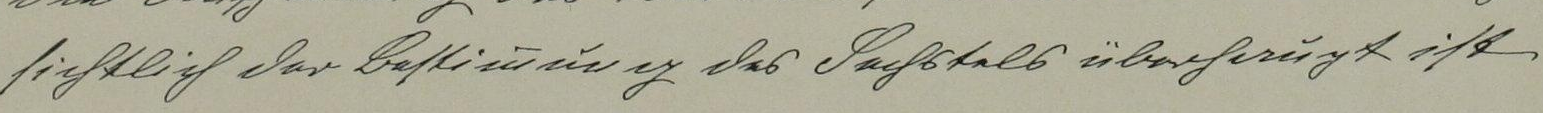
sichtlich der Bestimmung des Sechstels überhaupt ist
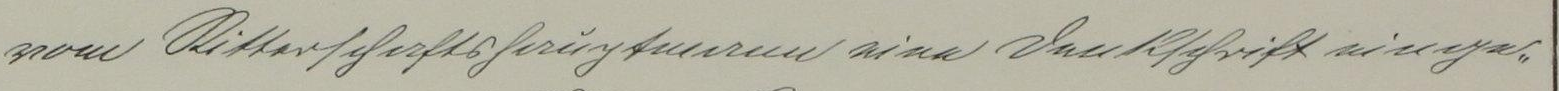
vom Ritterschaftshauptmann eine Denkschrift einge-
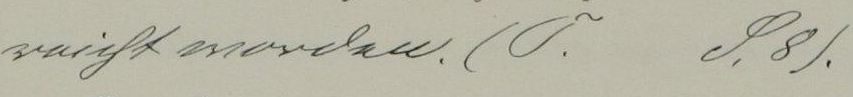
reicht worden. (T. S.8).
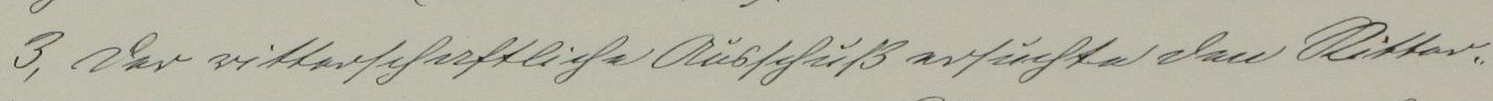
3. Der ritterschaftliche Ausschuß ersuchte den Ritter-
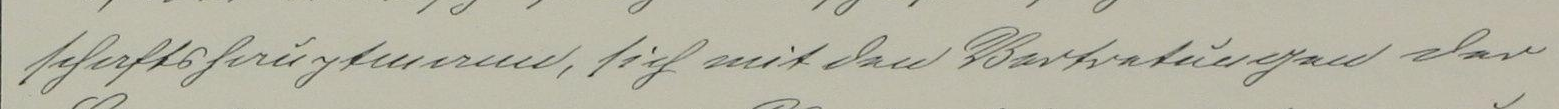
schaftshauptmann, sich mit den Vertretungen der
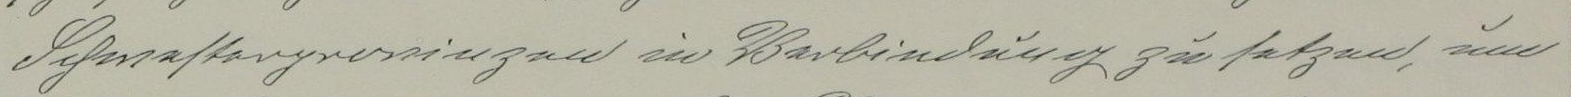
Schwesterprovinzen in Verbindung zu setzen, um
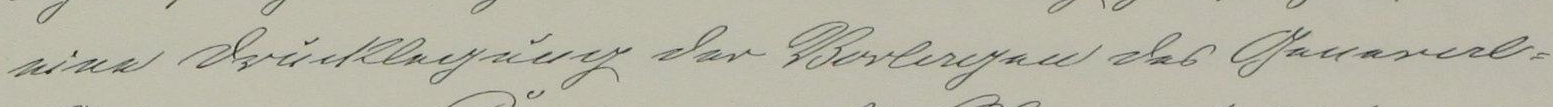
eine Drucklegung der Vorlagen des General-
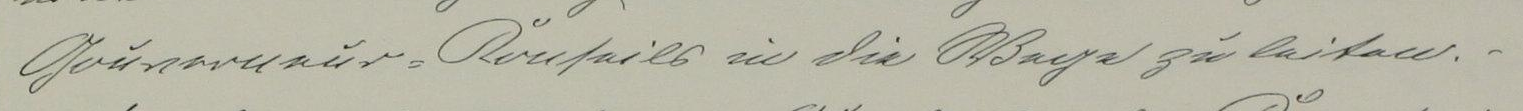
Gouverneur-Konseils in die Wege zu leiten.
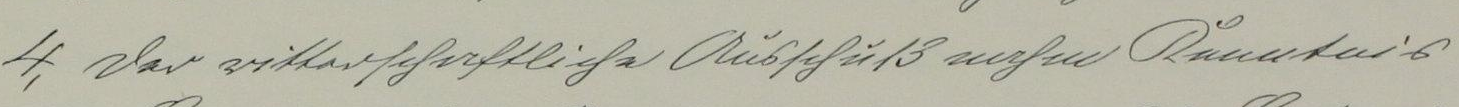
4. Der ritterschaftliche Ausschuß nahm Kenntnis
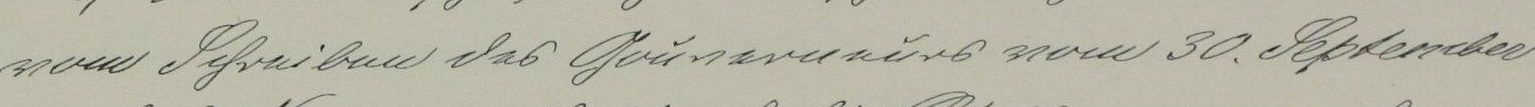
vom Schreiben des Gouverneurs vom 30. September
